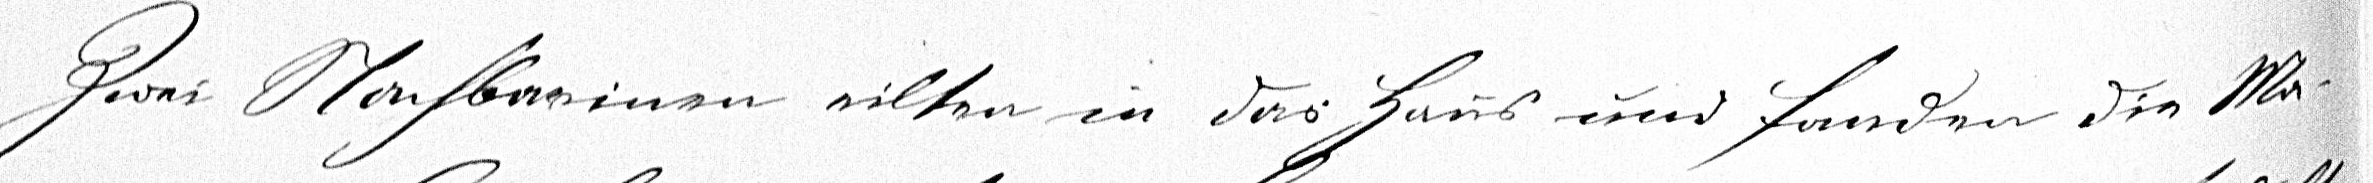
Zwei Nachbarinen eilten in das Haus und fanden die Ma¬
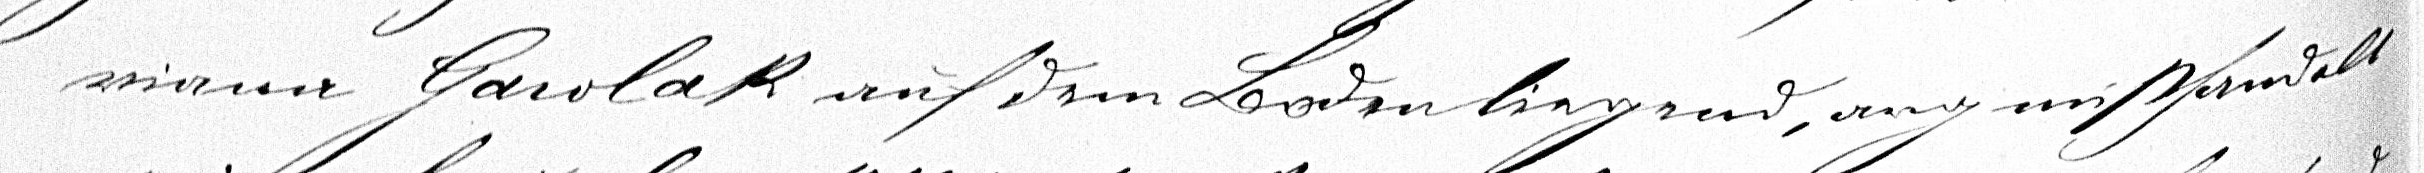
riana Gawlak auf dem Bodenliegend, argmißhandelt
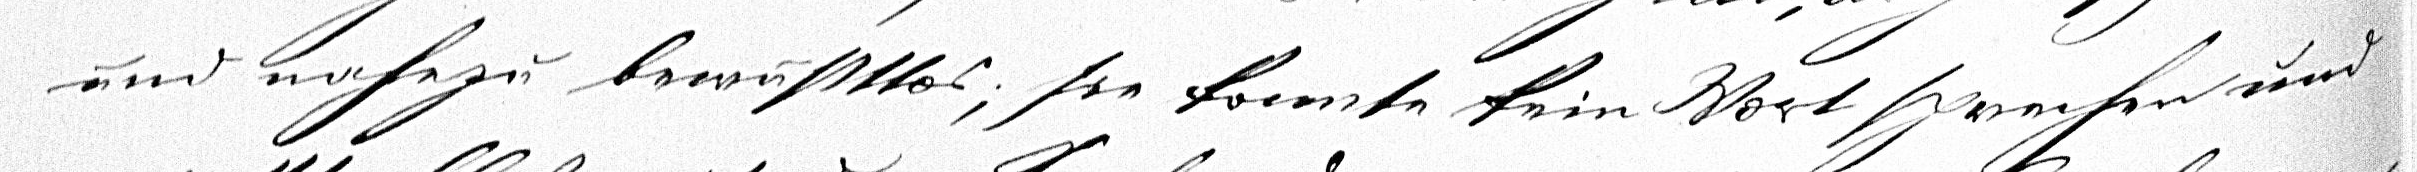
und nahezu bewußtlos; sie konnte kein Wortsprechen und
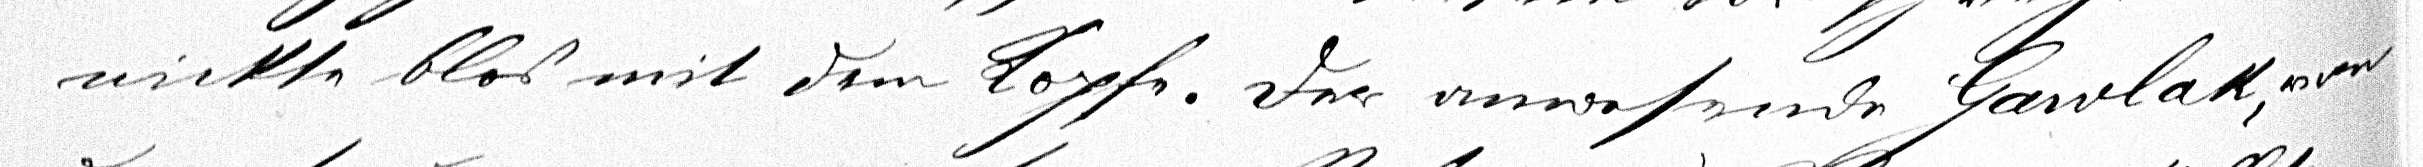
nickte blos mit dem Kopfe. Der anwesende Gawlak, von
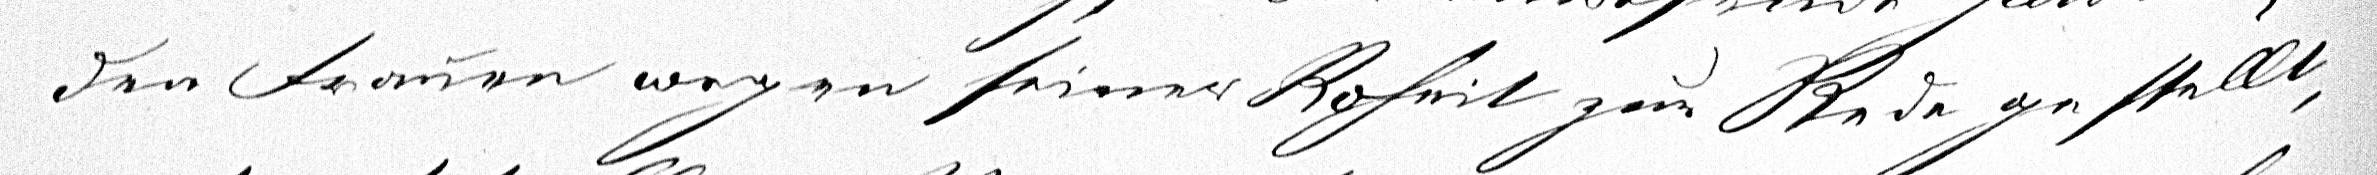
den Frauen wegen seiner Roheit zum Rede gestellt,
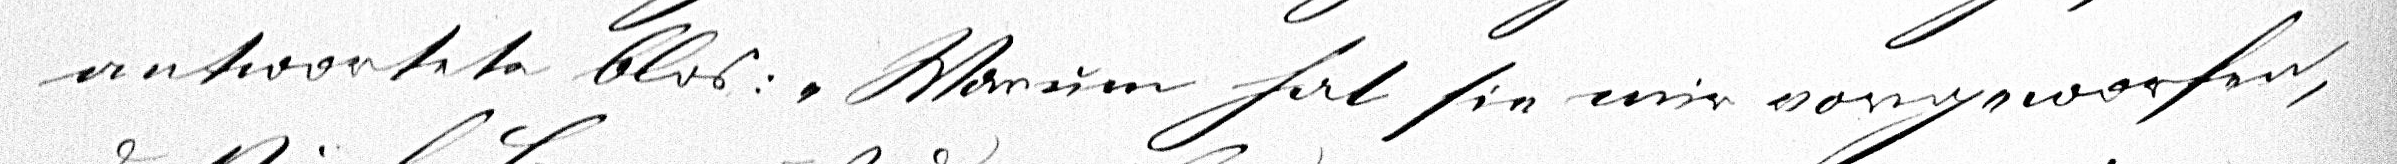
antwortete blos: „Warum hat sie mir vorgeworfen,
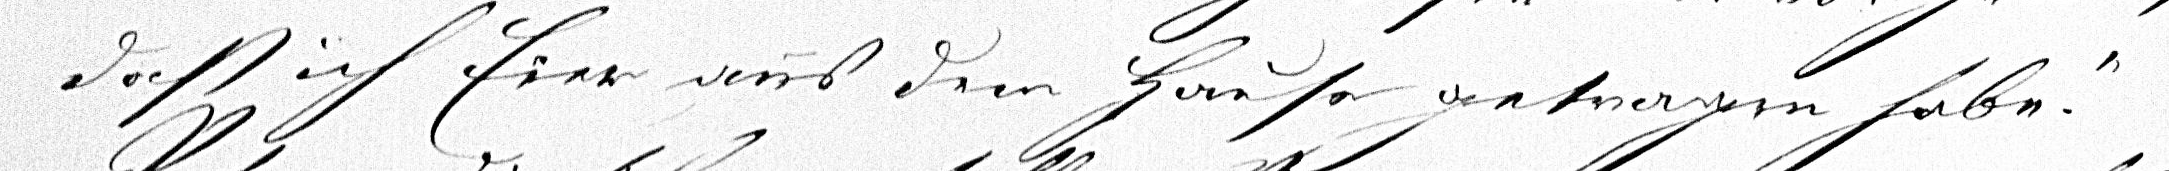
daß ich Eier aus dem Hause getragen habe.“
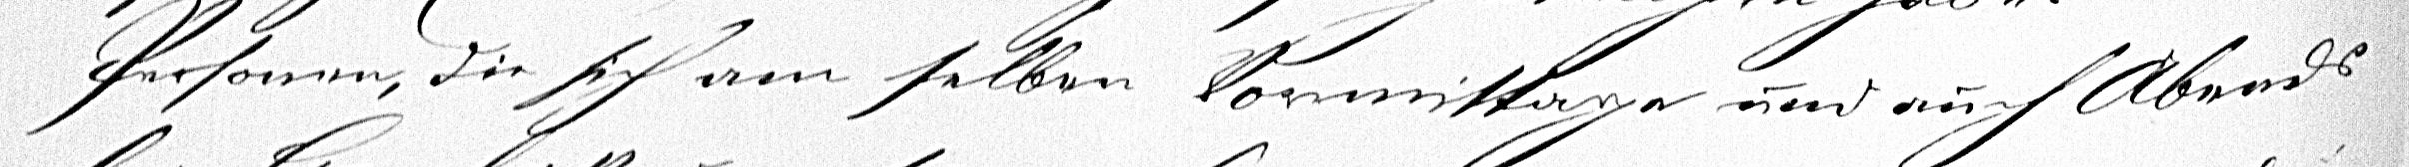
Personen, die sich am selben Vormittage und auch Abends
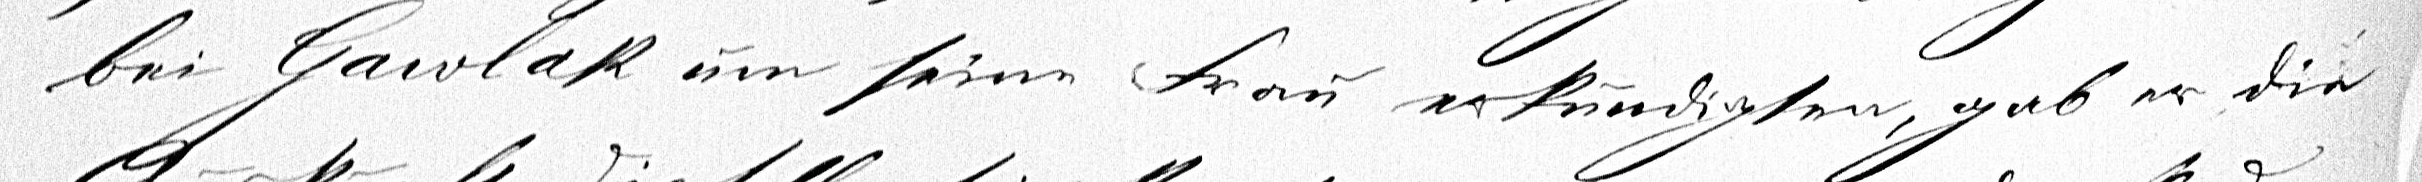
bei Gawlak um seine Frau erkundigten, gabs er die
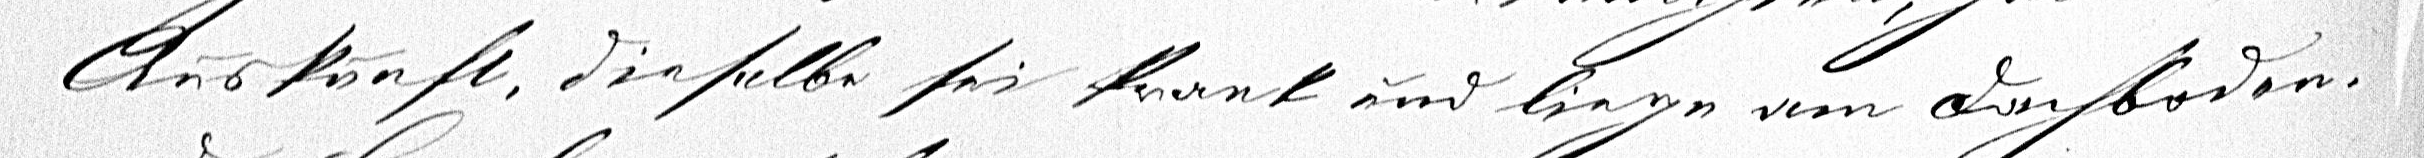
Auskunft, dieselbe sei krank und liege am Dachboden.
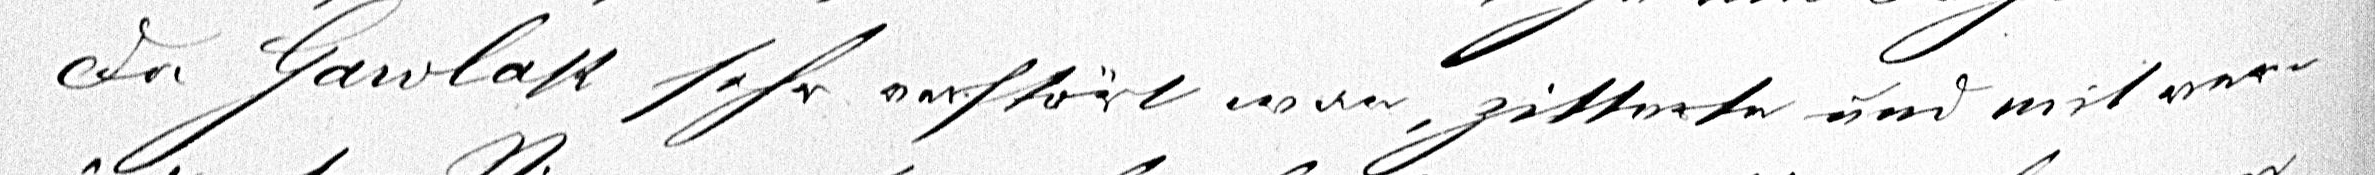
Da Gawlak sehr verstört war, zitterte und mit ver¬
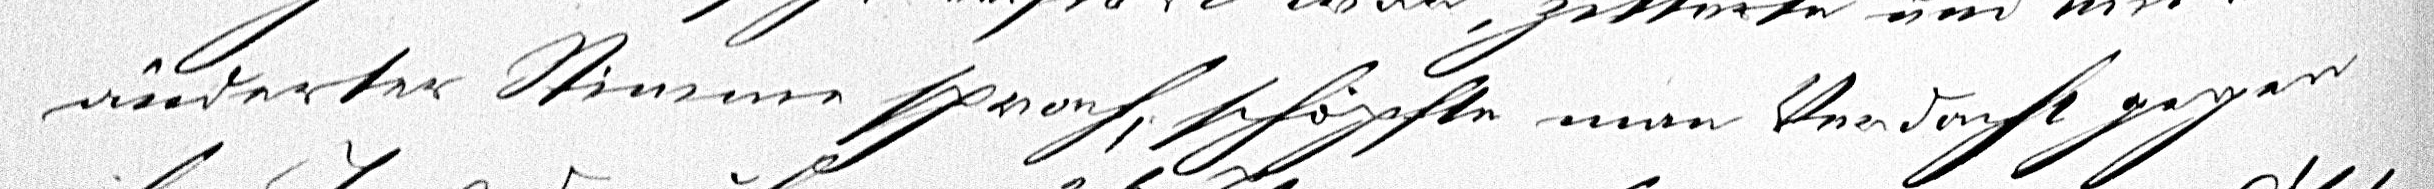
änderter Stimme sprach, schöpfte man Verdacht gegen
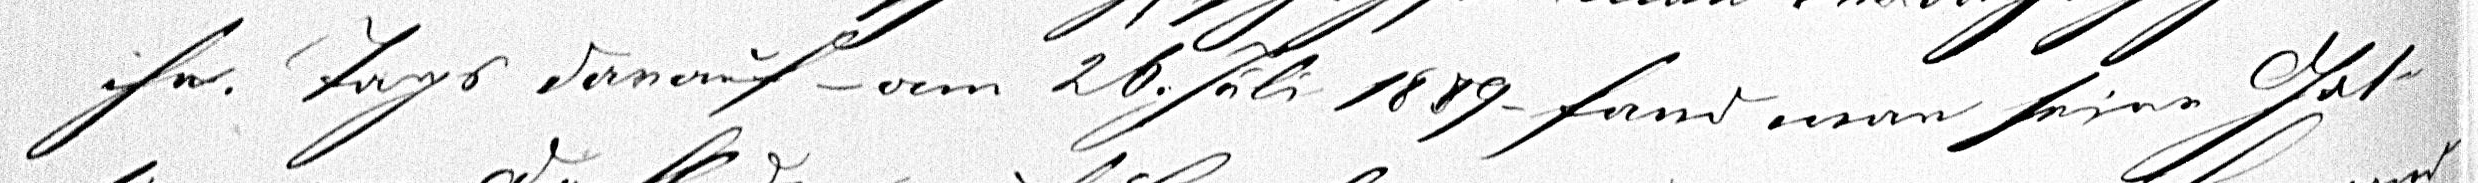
ihn. Tags darauf - am 26. Juli 1889 - fand man seine Gat¬
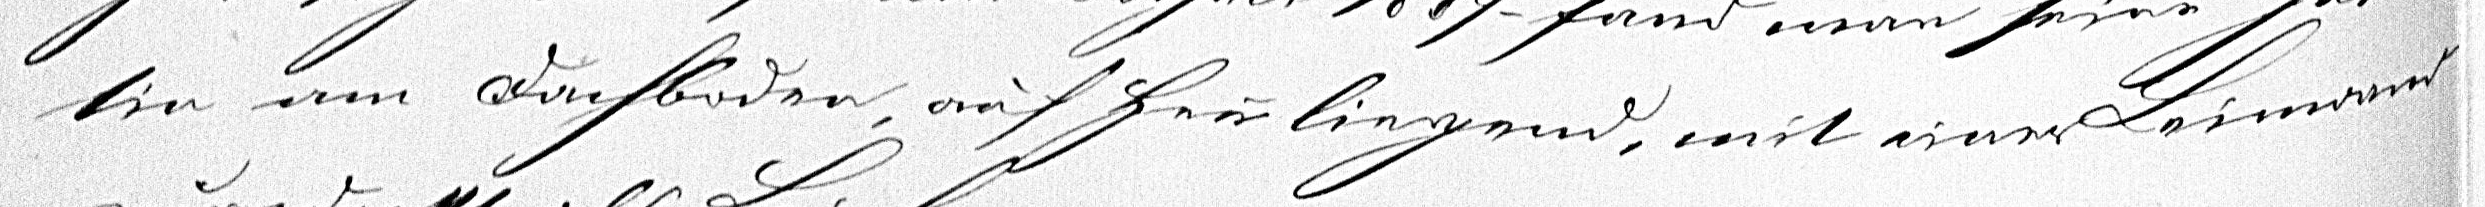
tin am Dachboden, auf Heuliegend, mit einer Leinwand
